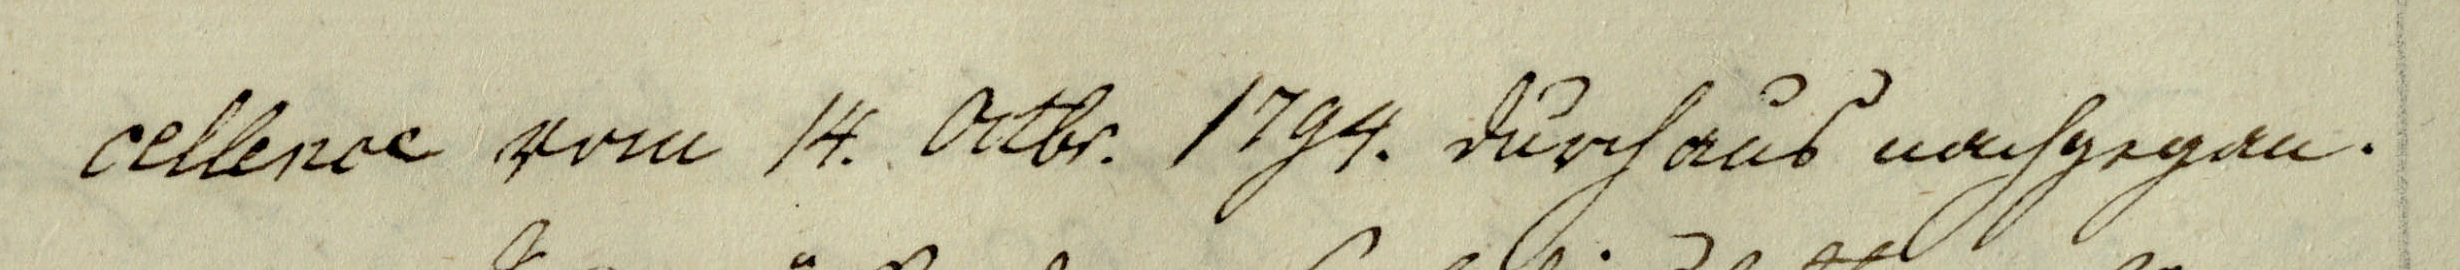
cellence vom 14. Octbr. 1794. durchaus nachgegan¬
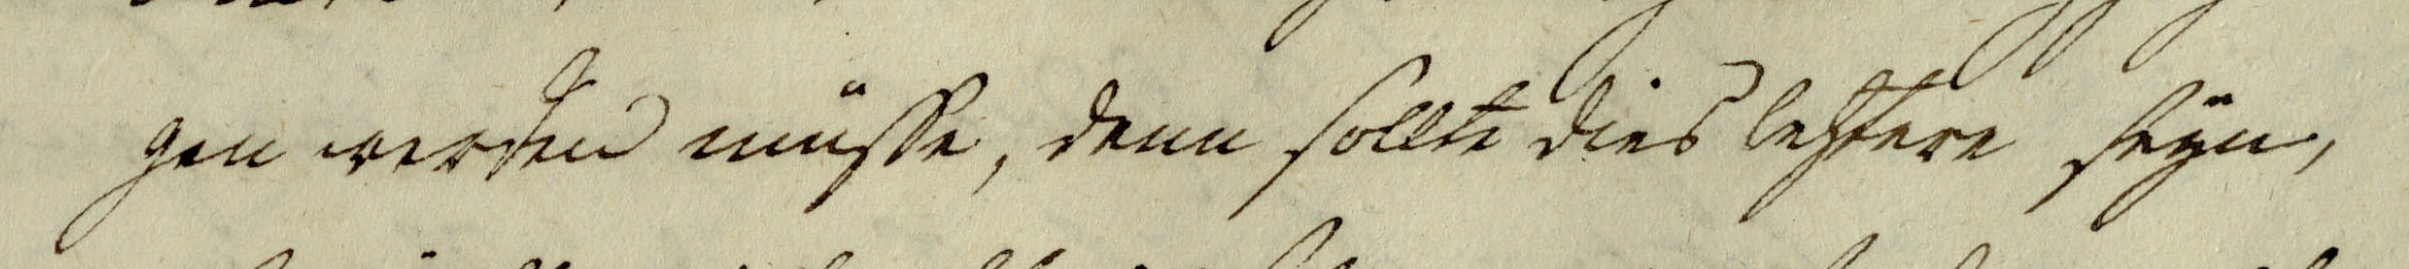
gen werden müsse, denn sollte dies letztere seÿn,
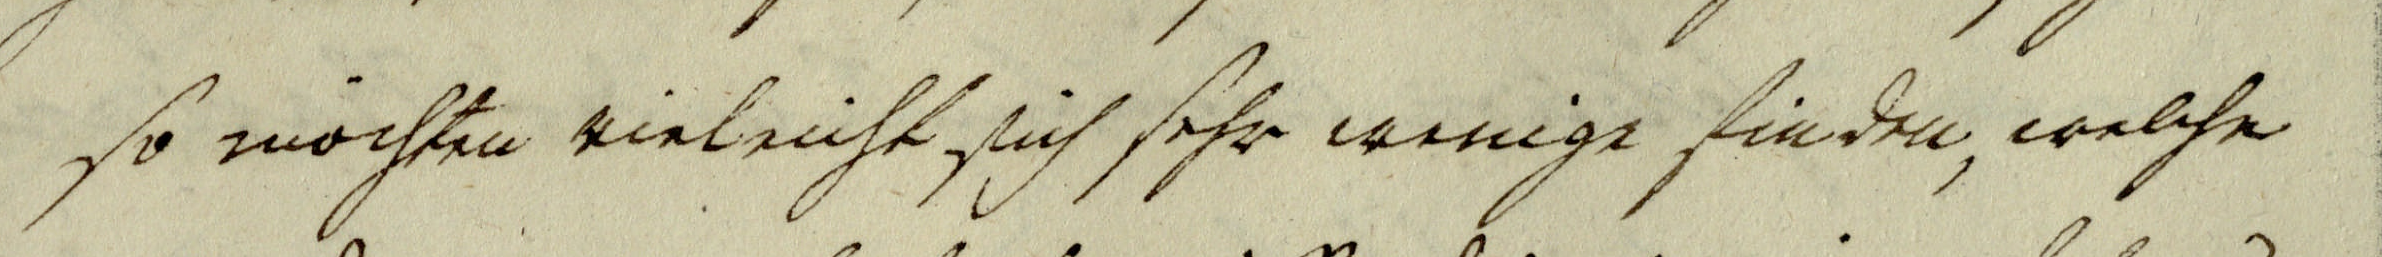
so möchten vieleicht sich sehr wenige finden, welche
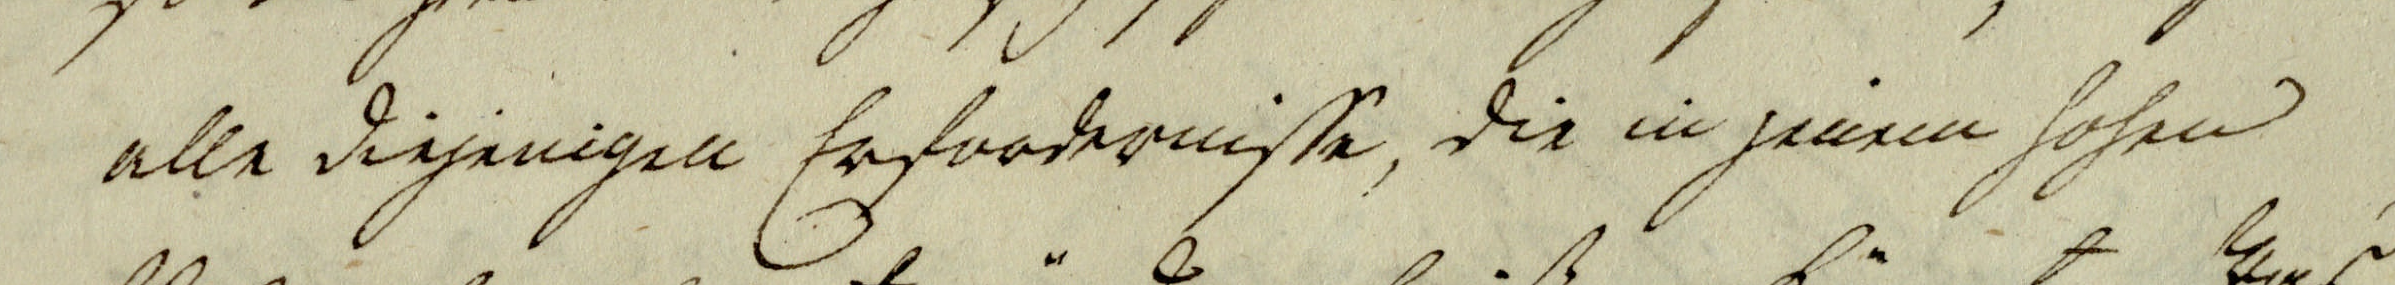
alle diejenigen Erfordernisse, die in jenem hohen
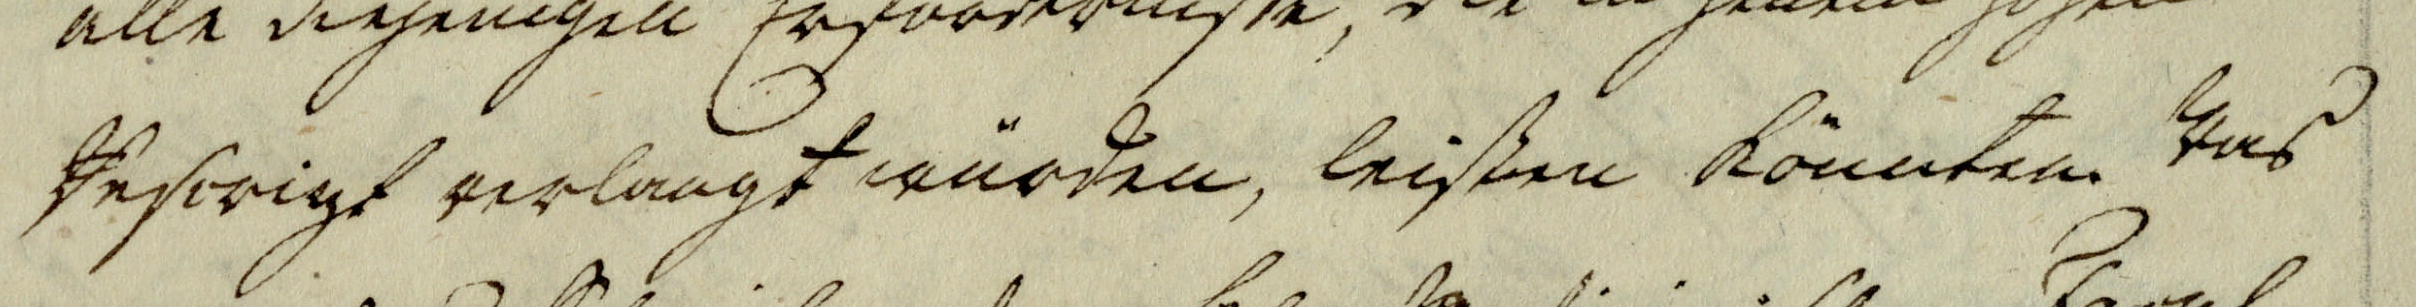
Rescript verlangt würden, leisten könnten. Was
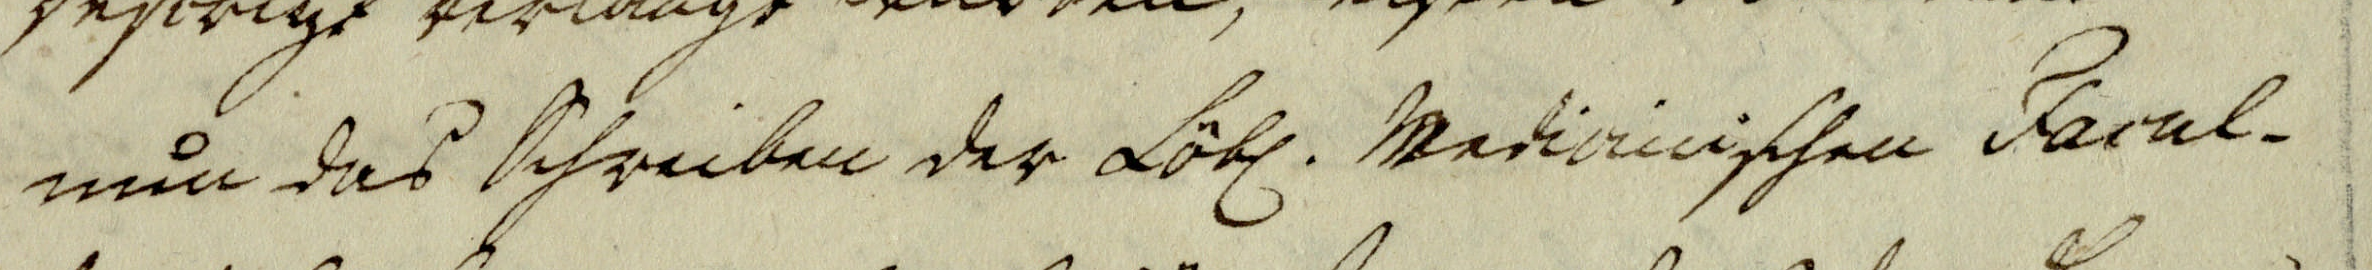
nun das Schreiben der Löbl. Medicinischen Facul¬
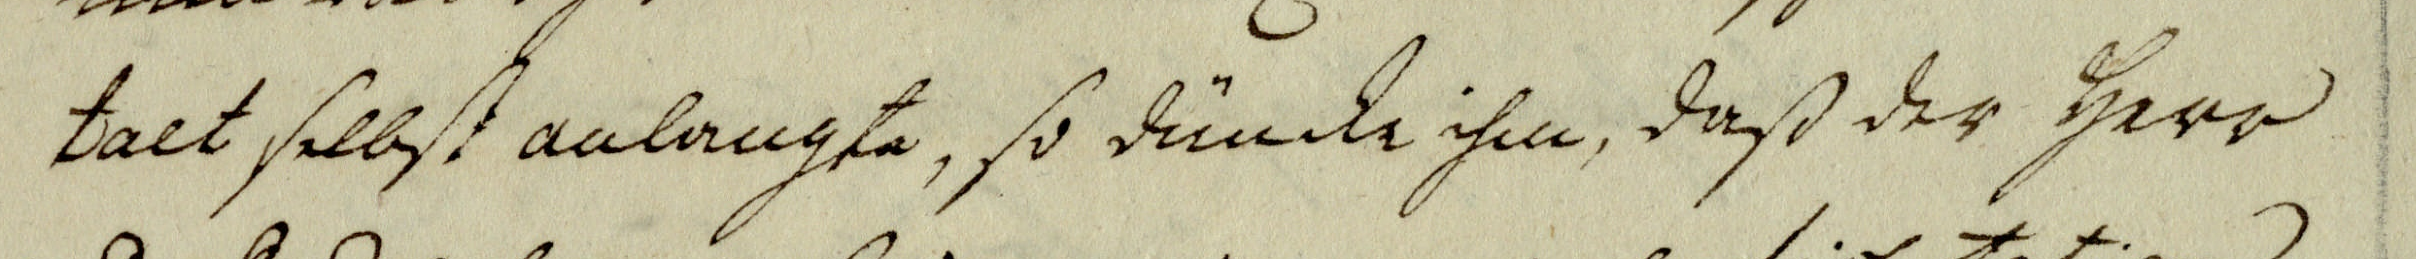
taet selbst anlangte, so düncke ihm, daß der Herr
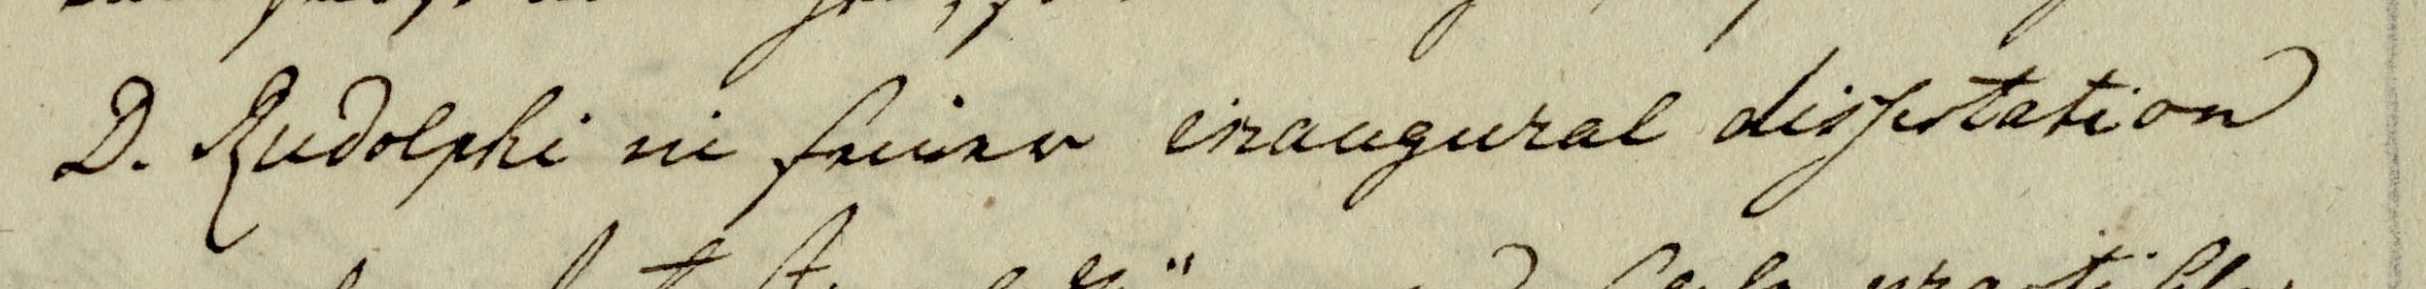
D. Rudolphi in seiner inaugural dissertation
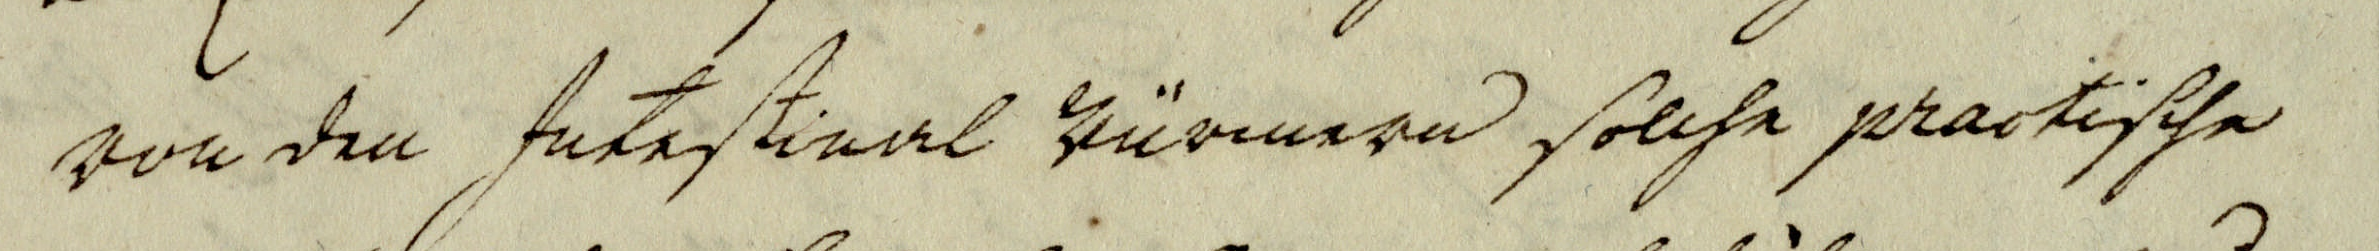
von den Intestinal Würmern solche practische
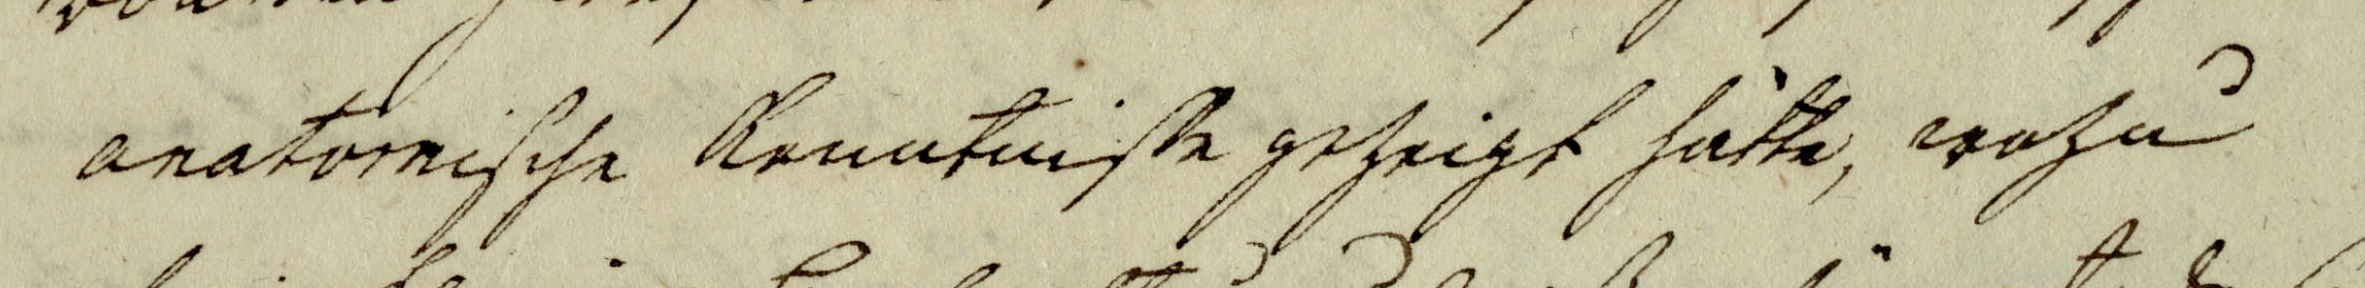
anatomische Kenntnisse gezeigt hätte, wozu
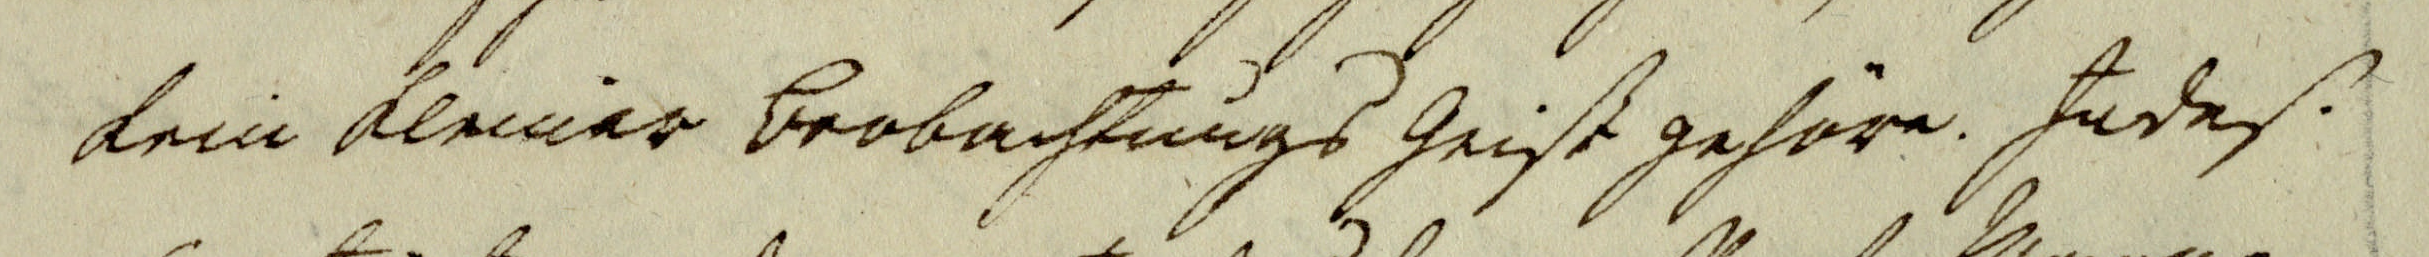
kein kleiner Beobachtungs Geist gehöre. Indes¬
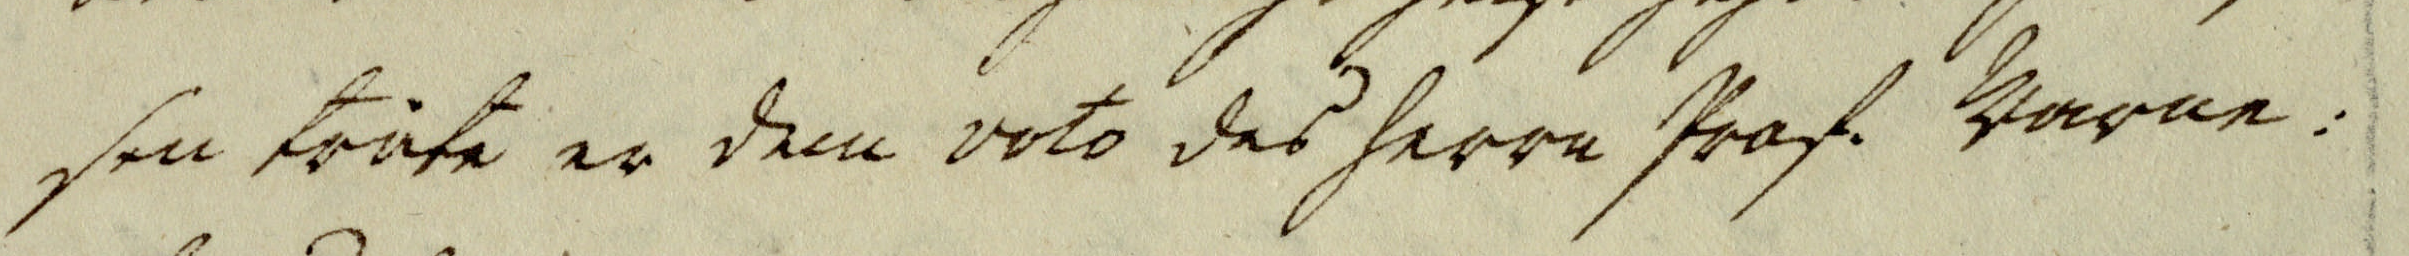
sen träte er dem voto des Herrn Prof. Warne¬
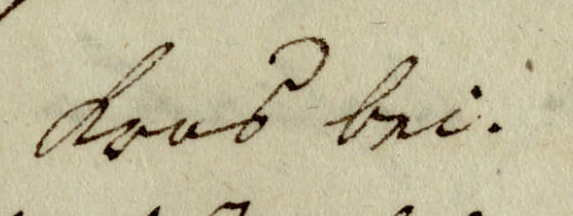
kros bei.
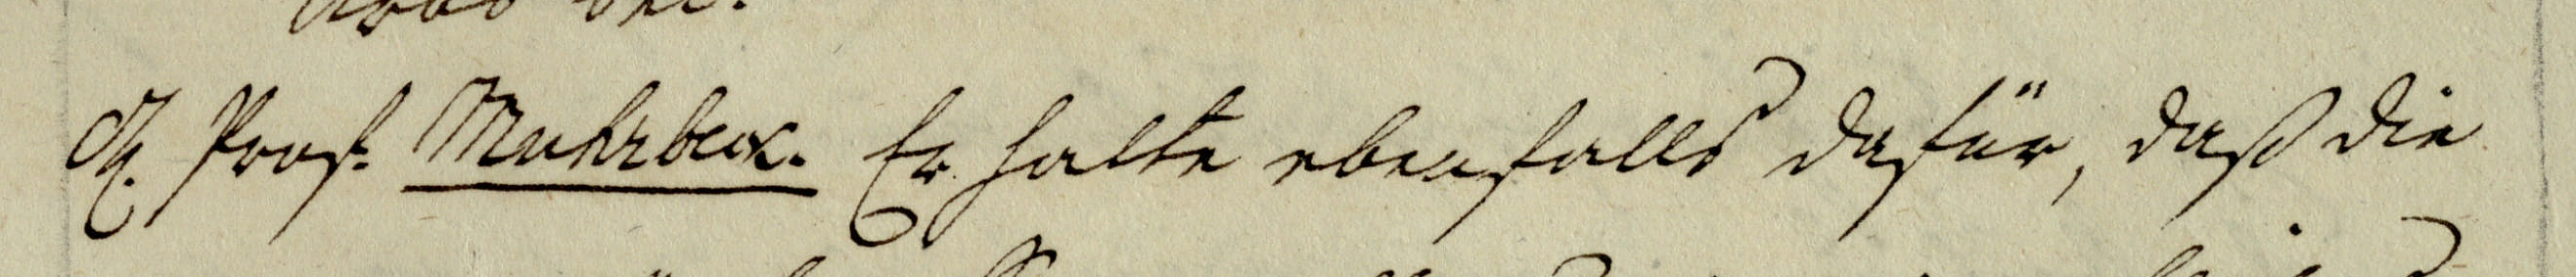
dh. Prof. Muhrbeck. Er halte ebenfalls dafür, daß die
